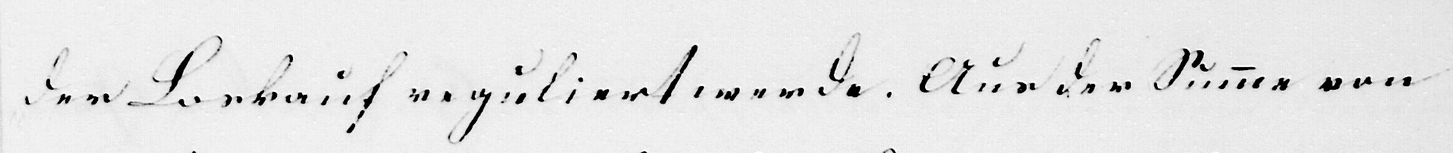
der Loskauf reguliert werde. Aus der Summe von
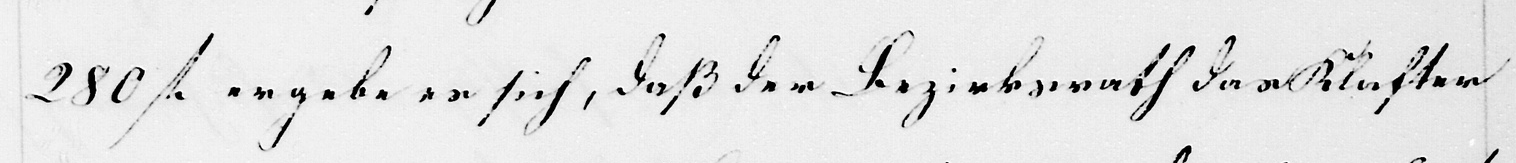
280 fl ergebe es sich, daß der Bezirksrath das Klafter
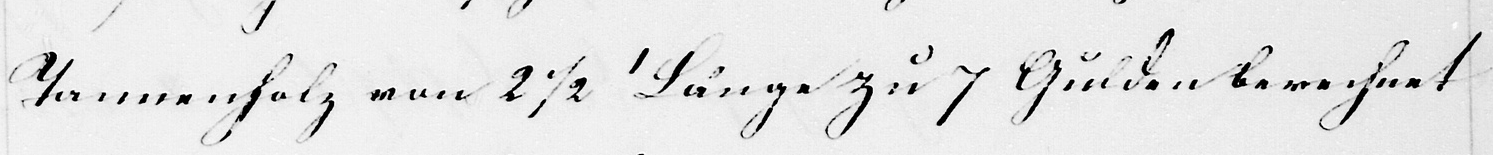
Tannenholz von 2 ½ [Fuss] Länge zu 7 Gulden berechnet
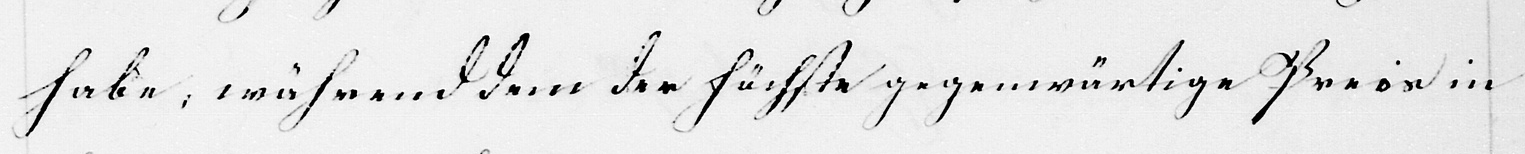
habe, während dem der höchste gegenwärtige Preis in
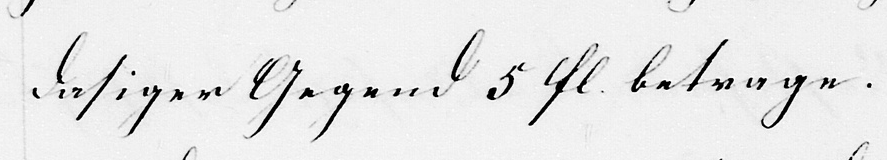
dasiger Gegend 5 fl betrage.
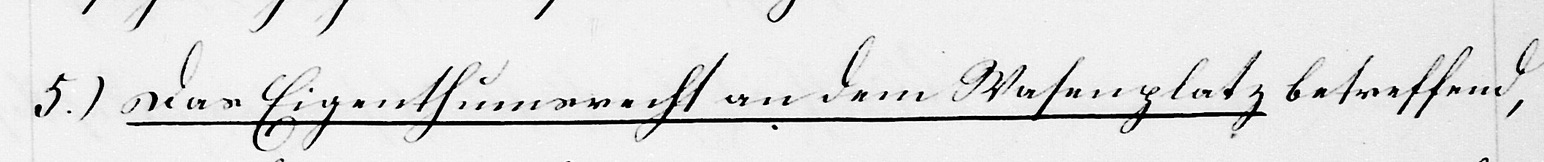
5.) Das Eigenthumsrecht an dem Wasenplatz betreffend,
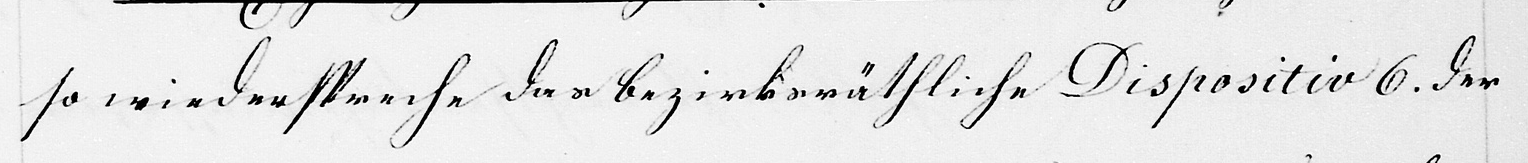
so wiederspreche das bezirksräthliche Dispositiv 6. der
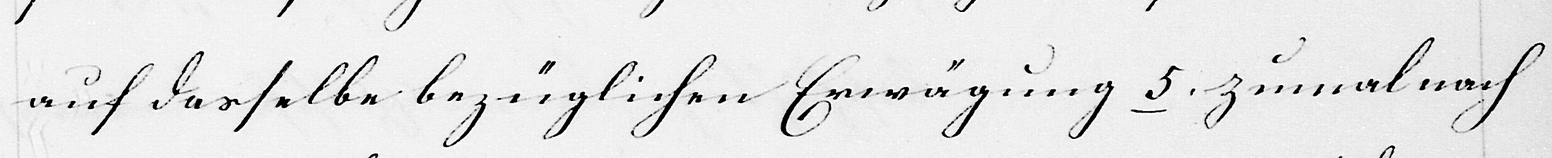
auf dasselbe bezüglichen Erwägung 5. zumal nach
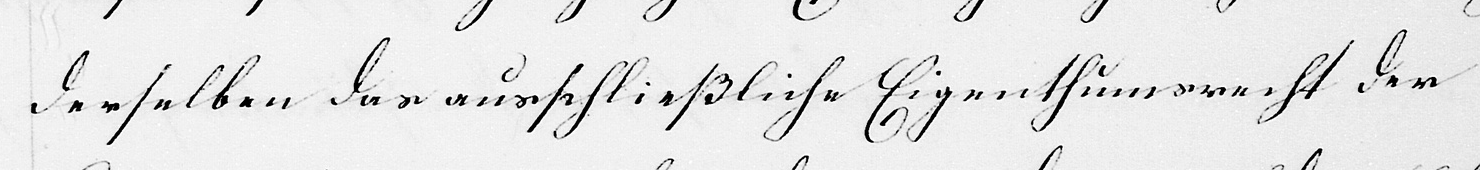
derselben das ausschließliche Eigenthumsrecht der
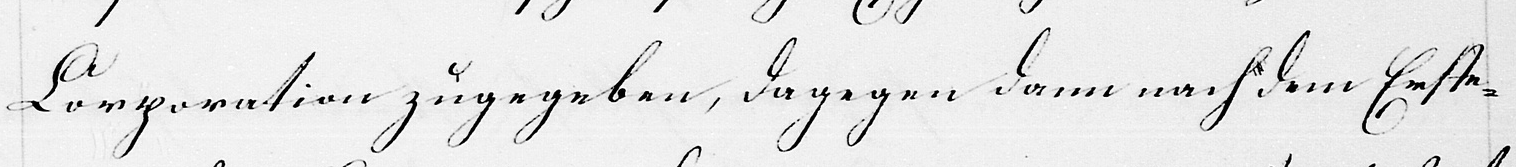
Corporation zugegeben, dagegen dann nach dem Erste¬
